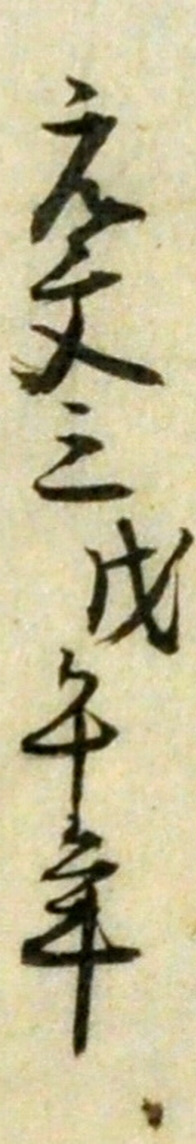元文三戊午
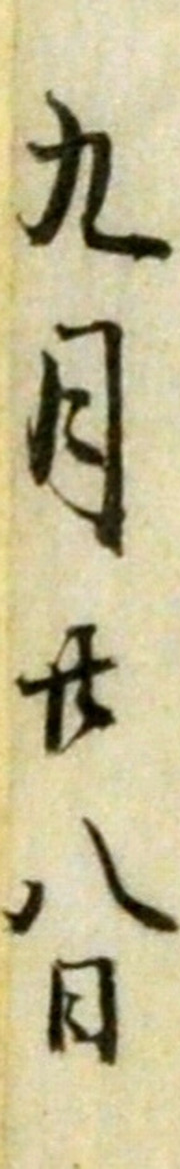九月廿八日
